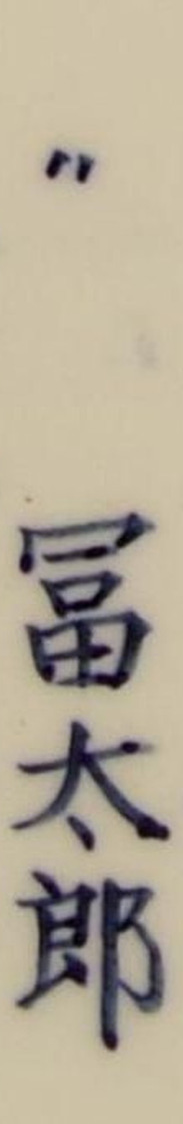冨太郎
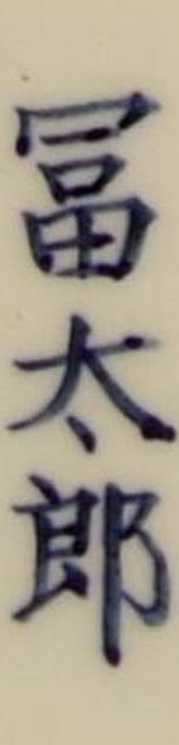冨太郎
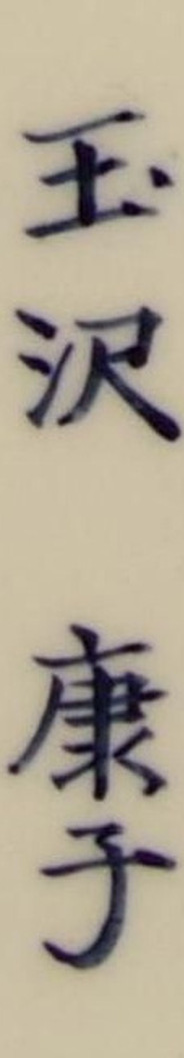玉沢康子
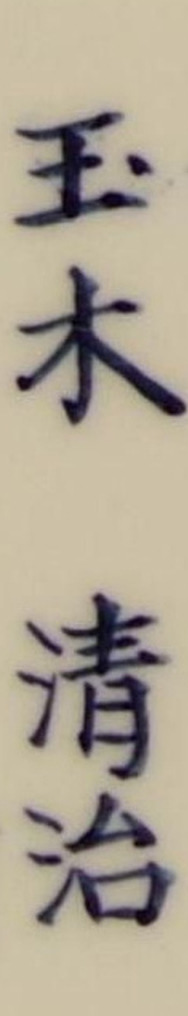玉木清治
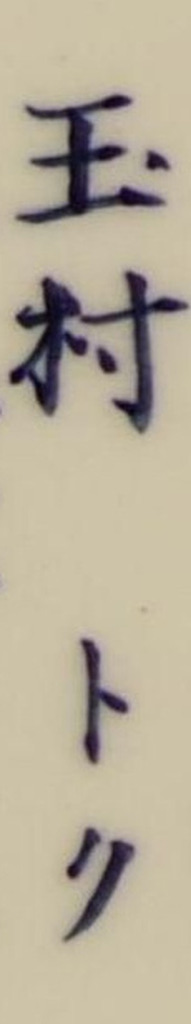玉村トク
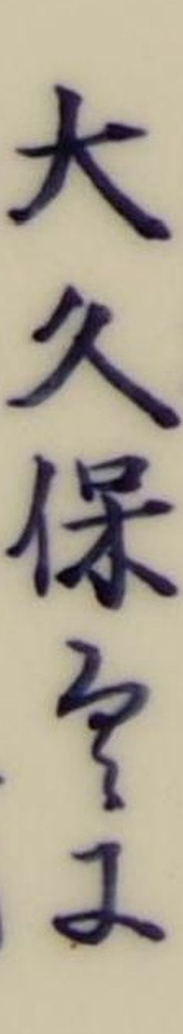大久保くに
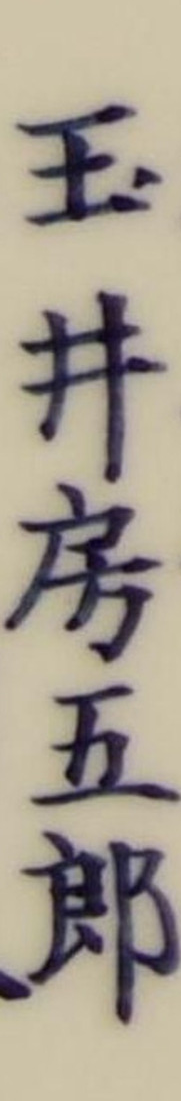玉井房五郎
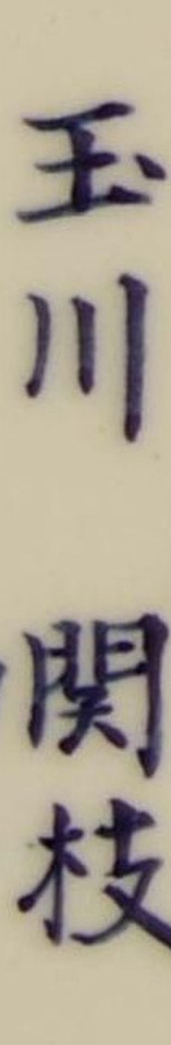玉川関枝

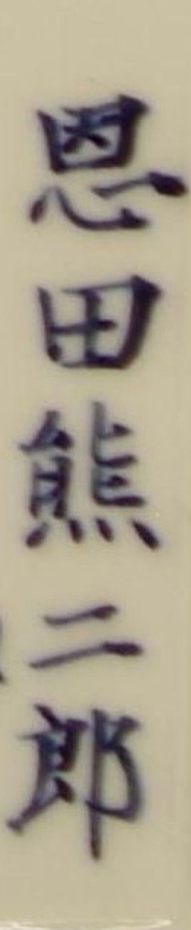恩田熊二郎
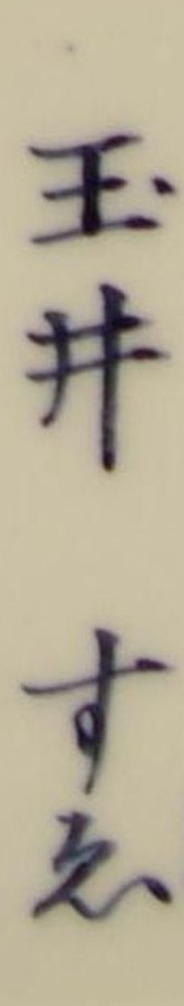玉井すゑ
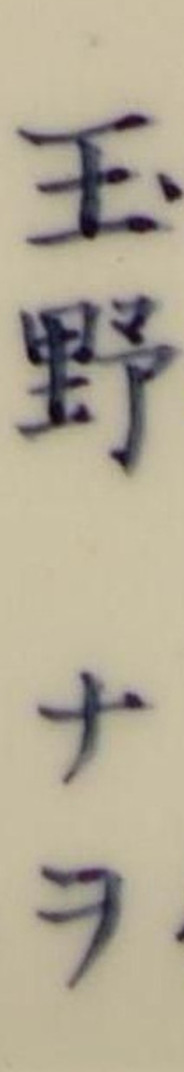玉野ナヲ
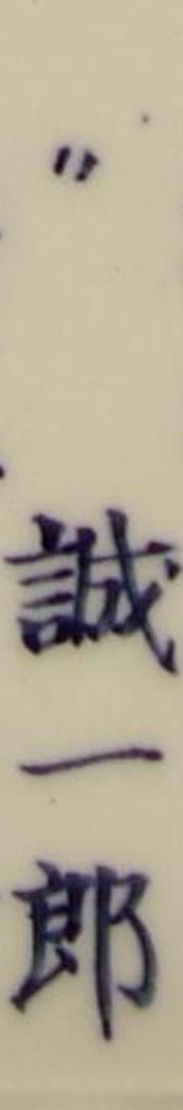誠一郎
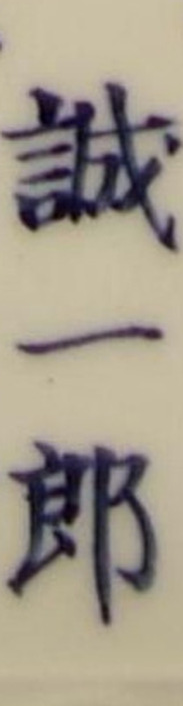誠一郎
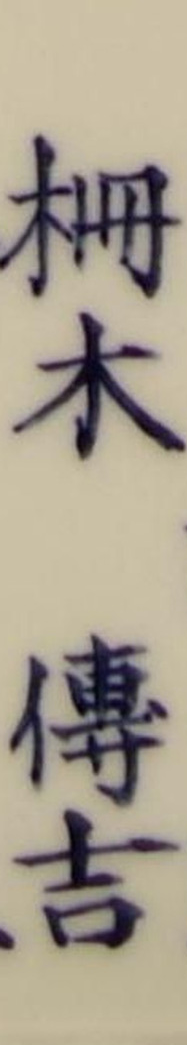柵木傳吉
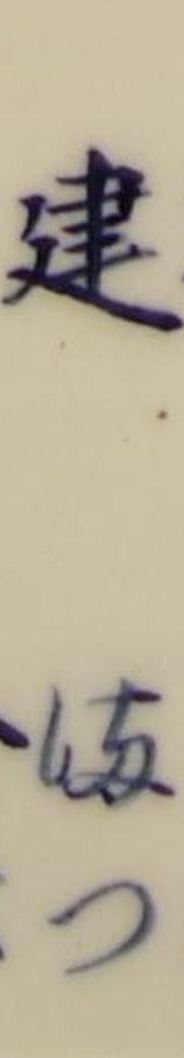建まつ
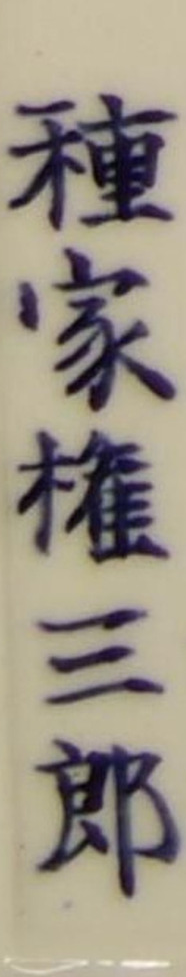種家権三郎
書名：E~L
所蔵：高野山金剛峯寺
